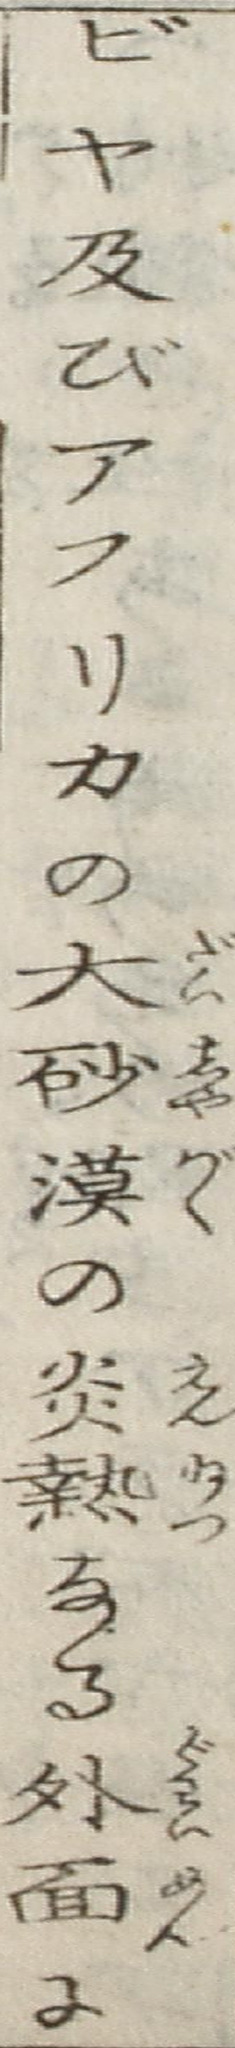ビヤ及びアフリカの大砂漠の炎熱なる外面に
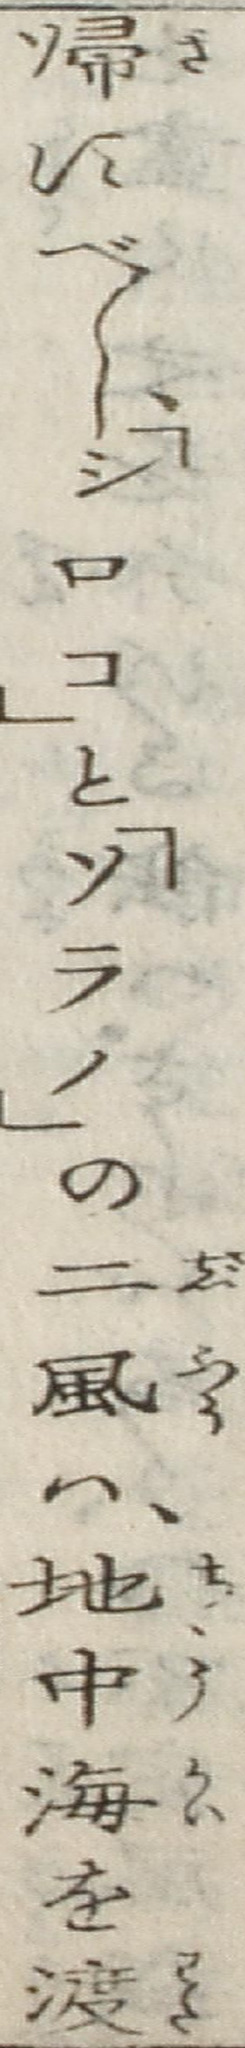帰すべし、「シコロ」と「ソラノ」の二風は、地中海を渡
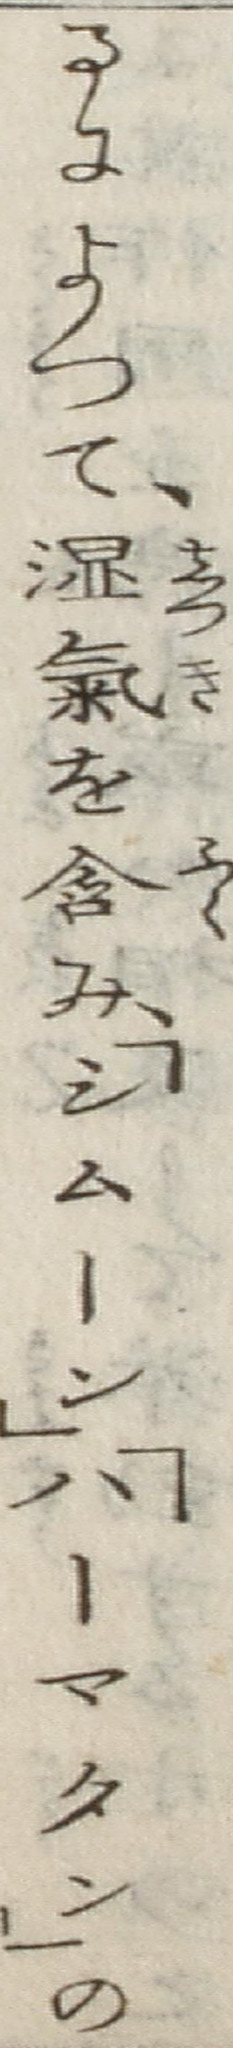るによつて、湿気を含み「シムーン」「ハーマタン」の
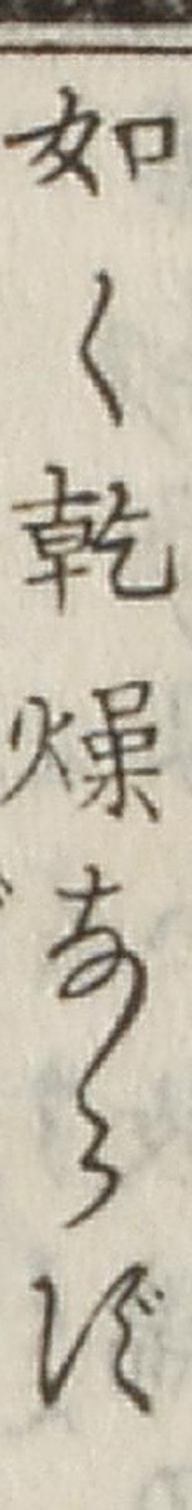如く乾燥ならず
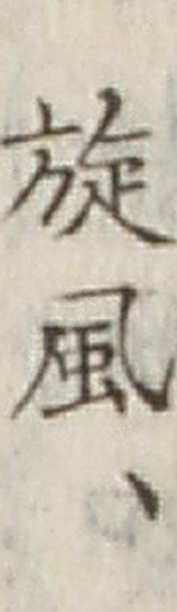旋風、
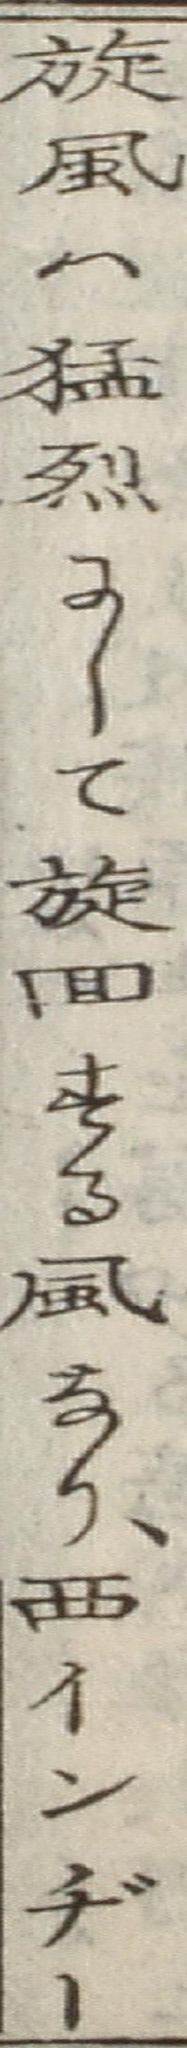旋風は猛烈にして旋回する風なり、西インヂー
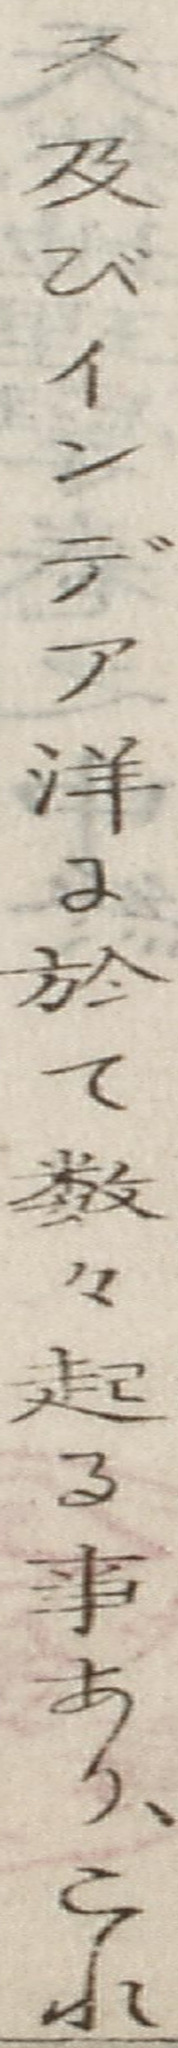ス及びインデア洋に於て数々起る事あり、これ
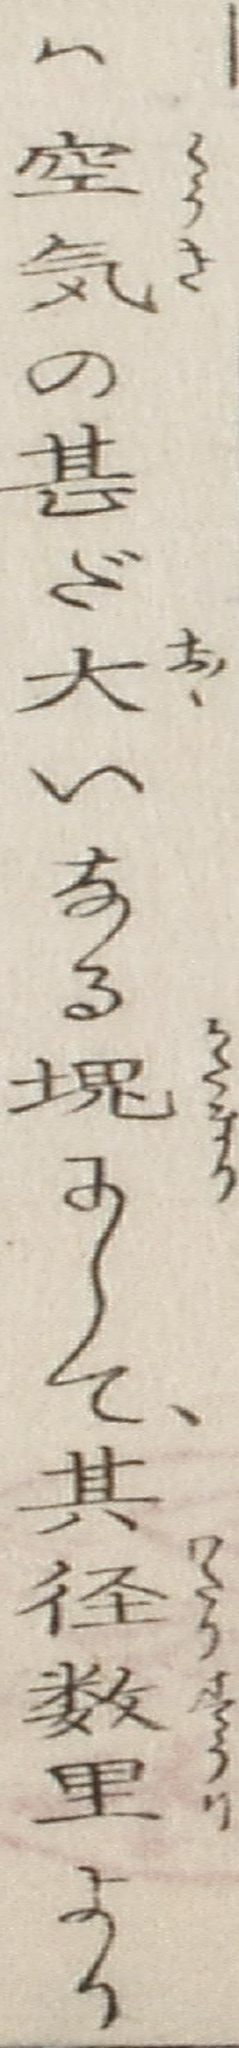は空気の甚だ大いなる塊にして、其径数里より
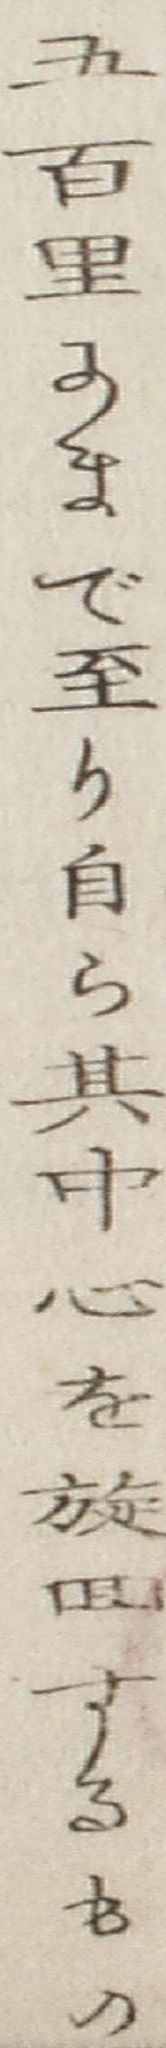五百里にまで至り自ら其中心を旋回するもの
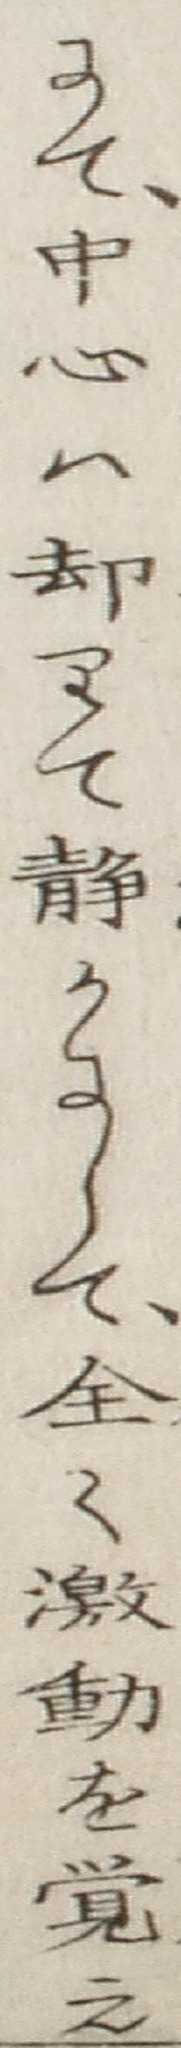にて、中心は却つて静かにして、全く激動を覚え
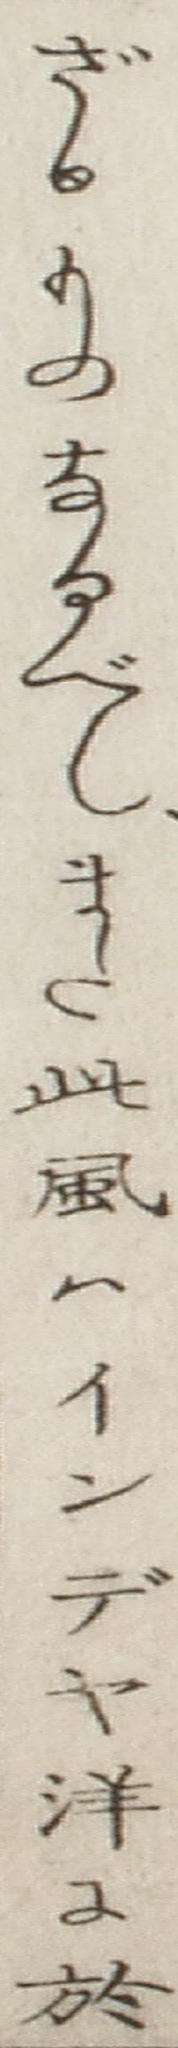ざるものなるべし、また此風はインデヤ洋に於
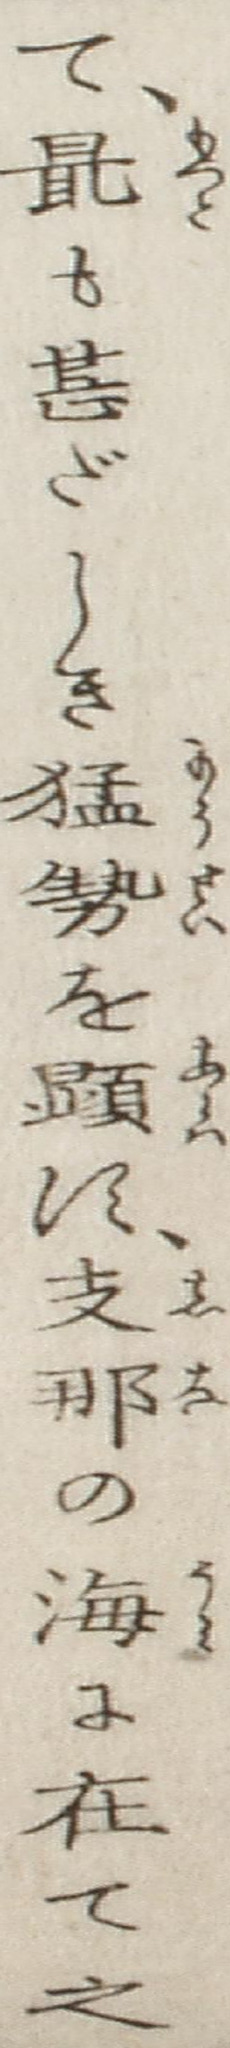て、最も甚だしき猛勢を顕す、支那の海に在て之
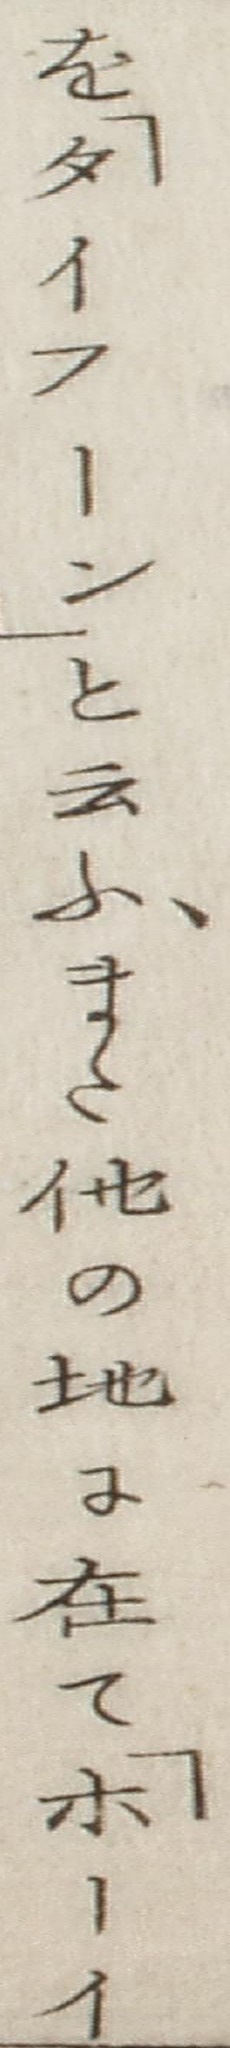を「タイフーン」と云ふ、また他の地に在て「ホーイ
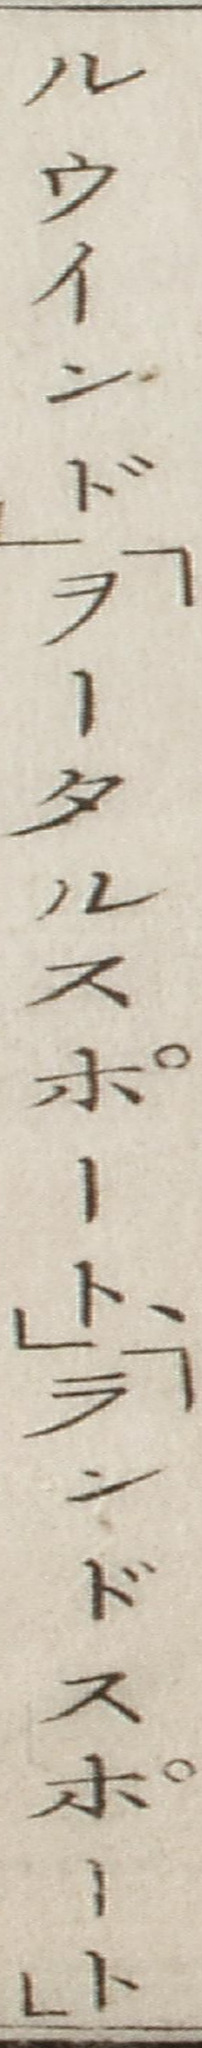ルウインド」「ヲータルスポート」、「ランドスポート」
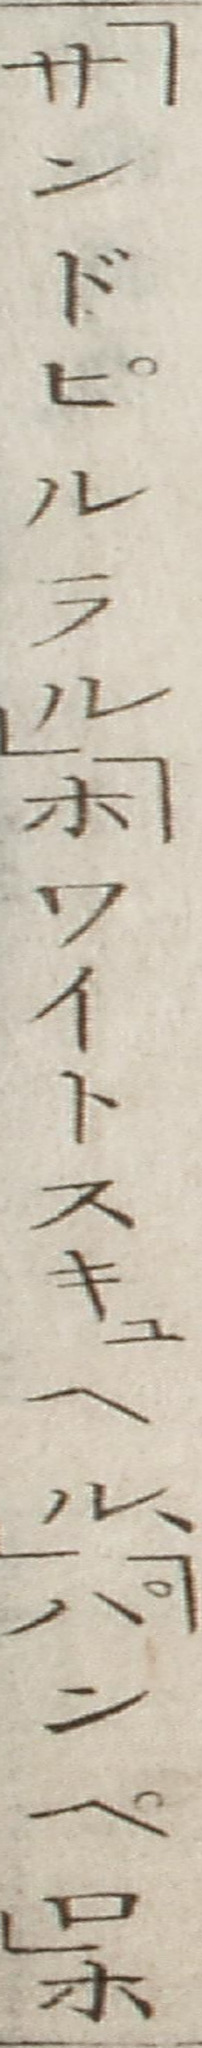「サンドピルラル」「ホワイトキュヘル」、「パンペロ」等

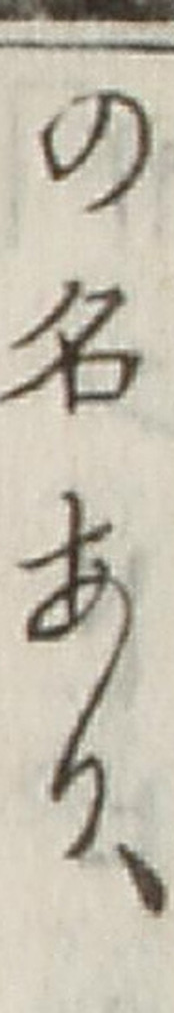の名あり、
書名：訓蒙　天然地理學　中
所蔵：東京大学地震研究所図書室 Earthquake Research Institute Library, The University of Tokyo, JAPAN
